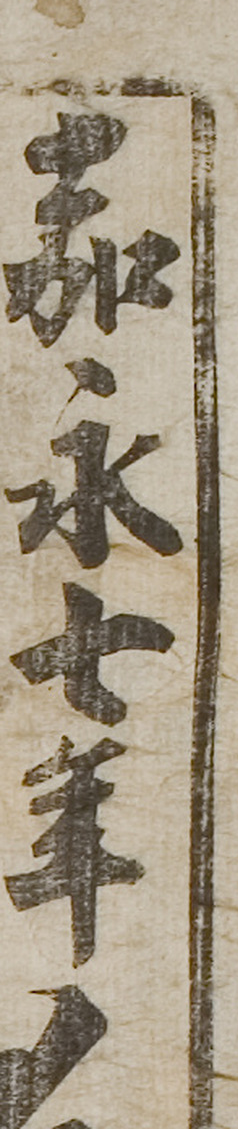嘉永七年
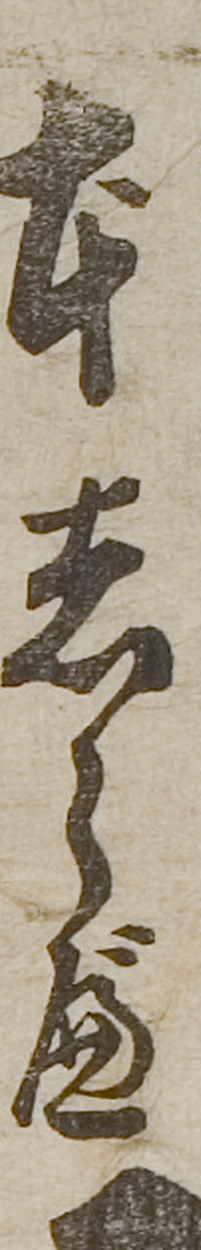本しらべ
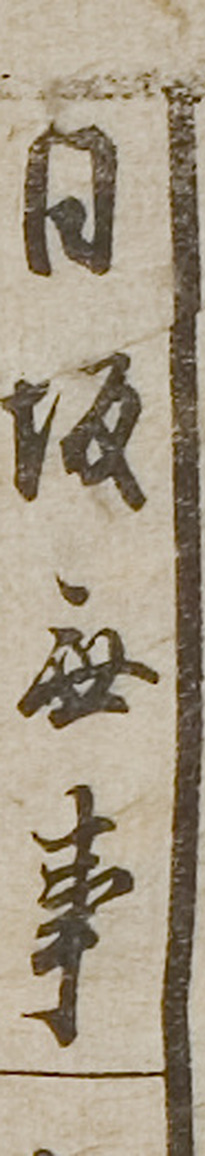日坂無事
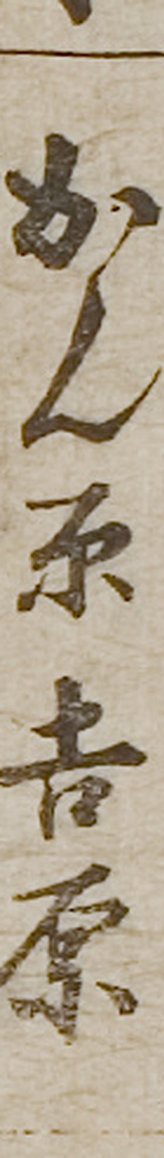かん原吉原
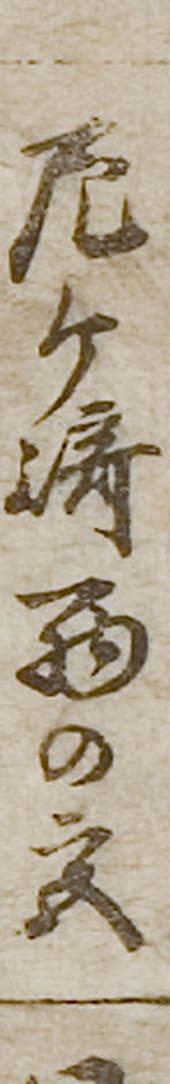尼ケ崎西の宮
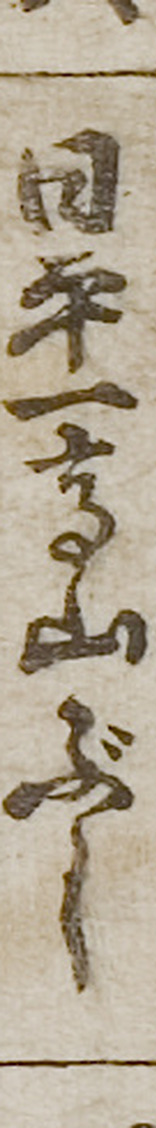日本一高山ぶし
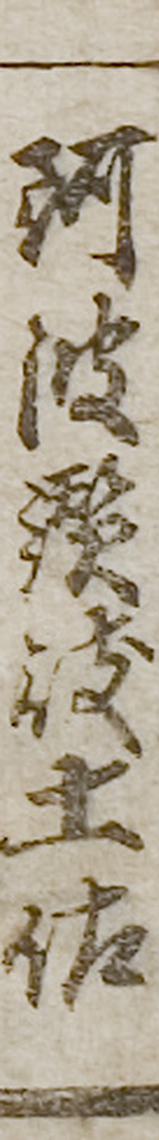阿波讃岐土佐
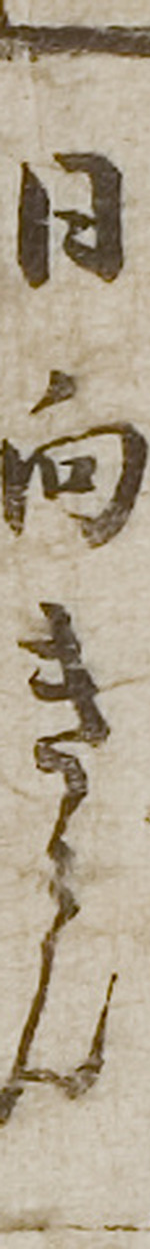日向きゝん
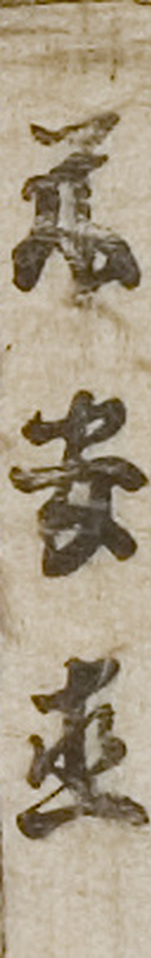米安直
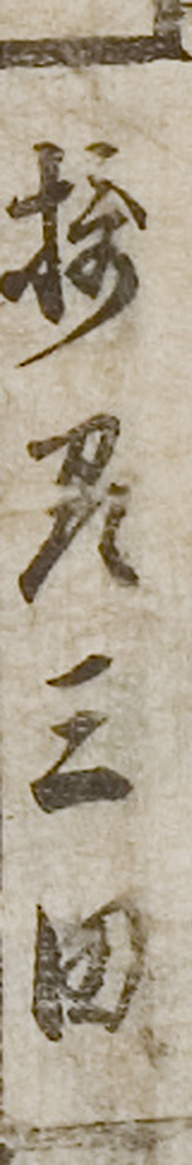摂州三田
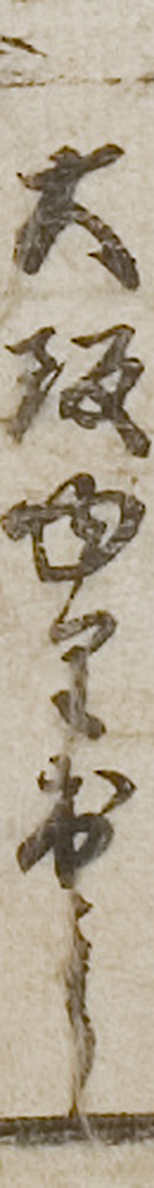大坂ゆり出し
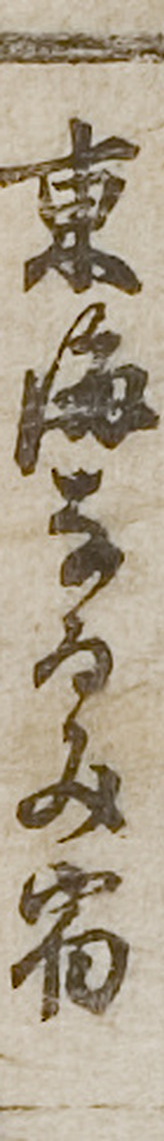東海なるみ宿
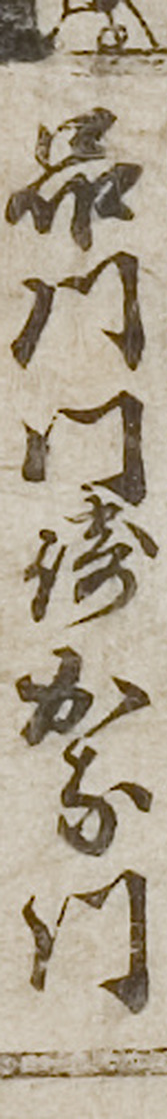品川川崎かな川
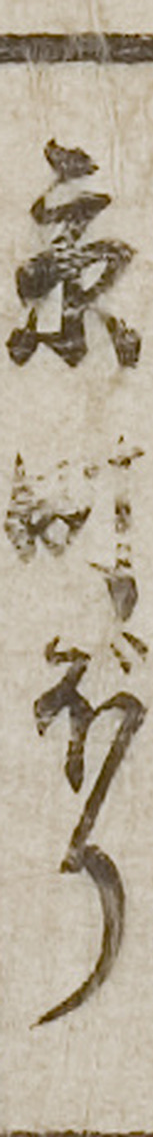京町ぼり
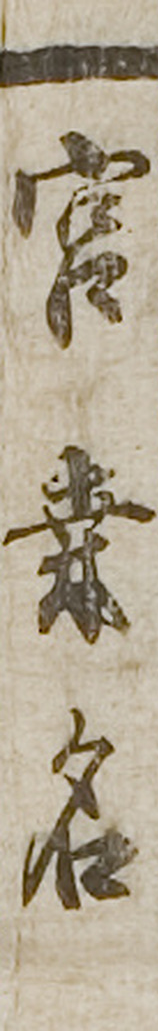宮桑名
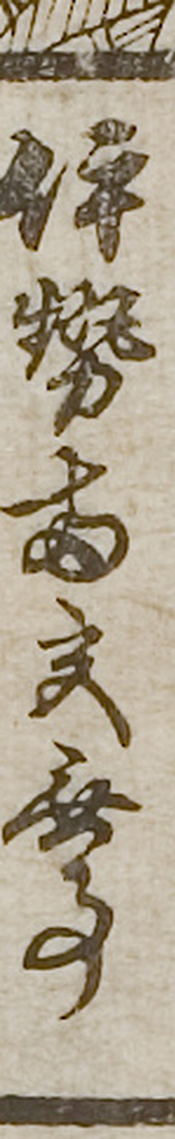伊勢両宮無事
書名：諸国大地震大津波末代噺
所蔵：東京大学総合図書館 General Library in the University of Tokyo, JAPAN
